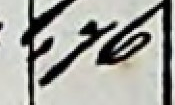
1,76
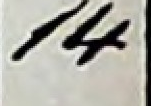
14
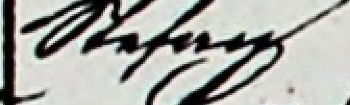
Stefan
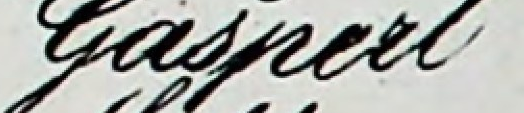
Gasperl
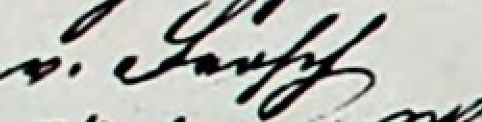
v. Frosch
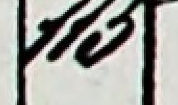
115
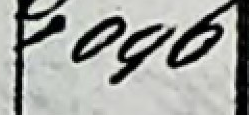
0,096
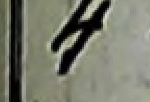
4
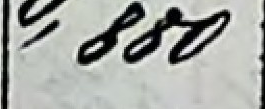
0,880
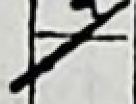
7
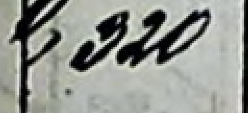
0,320
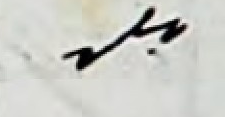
do
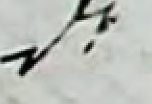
do
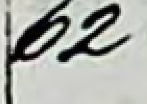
62
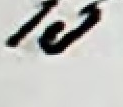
15
